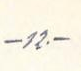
12
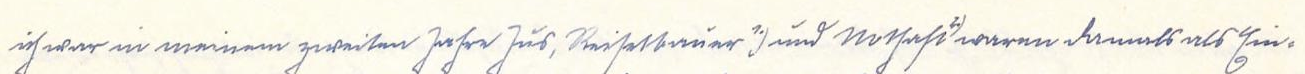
war in meinem zweiten Jahre Jus, Reiselbauer 1) und Nothaft 2)waren damals als Ein-
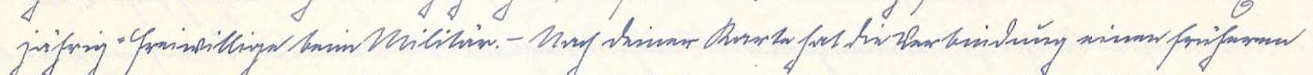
jährig-Freiwillige beim Militär. Nach deiner Karte hat die Verbindung einen früheren
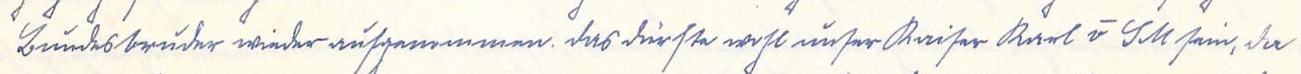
Bundesbruder wieder aufgenommen. Das dürfte wohl unser Kaiser Karl v/o SM sein, da
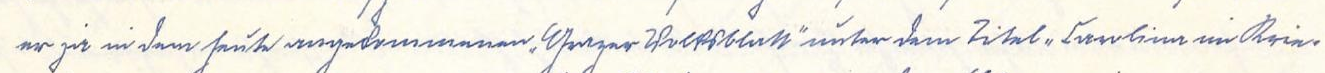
er ja in dem heute angekommenen „Grazer Volksblatt“ unter dem Titel „Carolina im Krie-
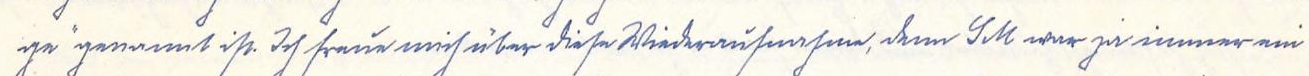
genannt ist. Ich freue mich über diese Wiederaufnahme, denn SM war ja immer ein
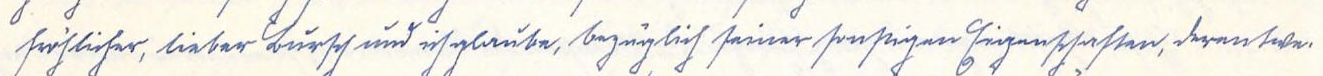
fröhlicher, lieber Bursch und ich glaube, bezüglich seiner sonstigen Eigenschaften, derentwe-
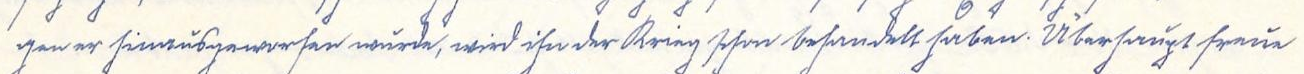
gen er hinausgeworfen wurde, wird ihn der Krieg schon behandelt haben. Überhaupt freue
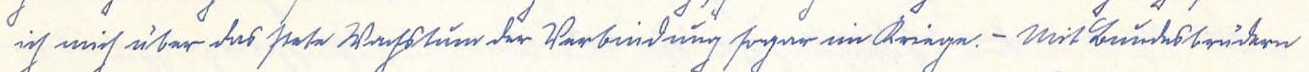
ich mich über das stete Wachstum der Verbindung sogar im Kriege. – Mit Bundesbrüdern
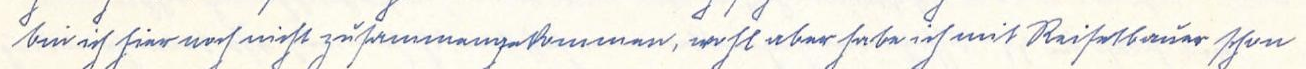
bin ich hier noch nicht zusammengekommenm wohl aber habe ich mit Reiselbauer schon
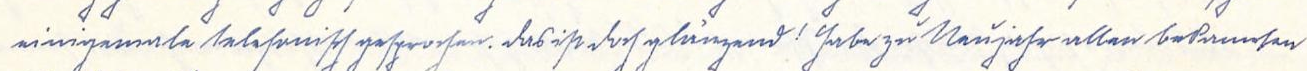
einigemale telefonisch gesprochen. Das ist doch glänzend! Aber zu Neujahr allen bekannten
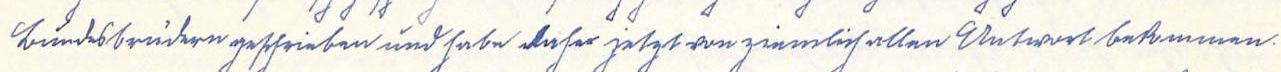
Bundesbrüdern geschrieben und habe daher jetzt von ziemlich allen Antwort bekommen.
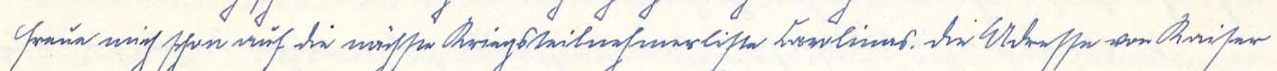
Freue mich schon auf die nächste Kriegsteilnehmerliste Karolinas. Die Adressen von Kaiser
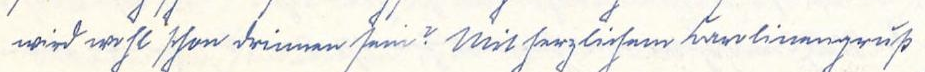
wird wohl schon drinnen sein! Mit herzlichem Karolinengruß
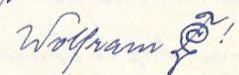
Wolfram!
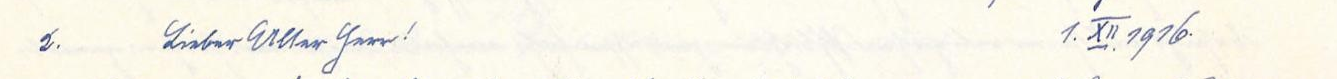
2. Lieber Alter Herr! 1.XII.1916
